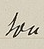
schon
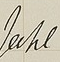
nach
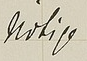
Berlin und
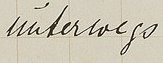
unterwegs.
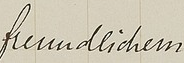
freundlichem
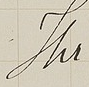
Ihr
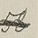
Bern
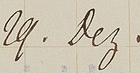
29. Dez.
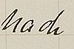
1876.
